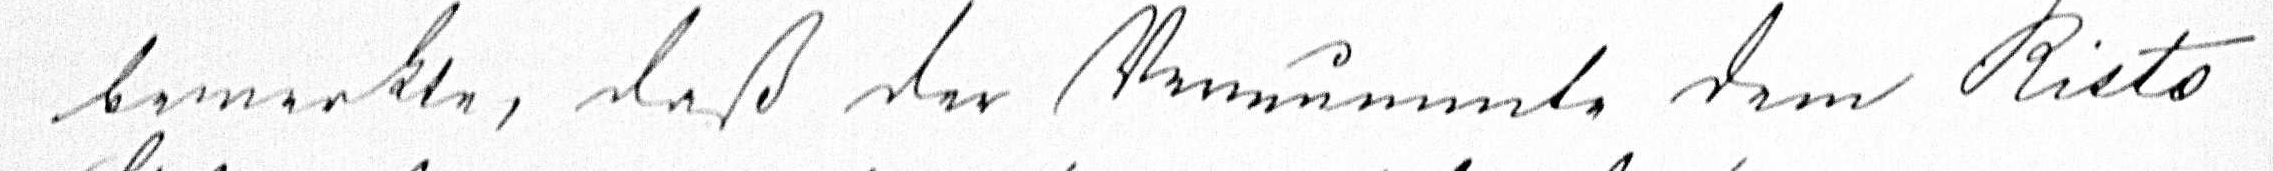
bemerkte, daß der Vermummte den Risto
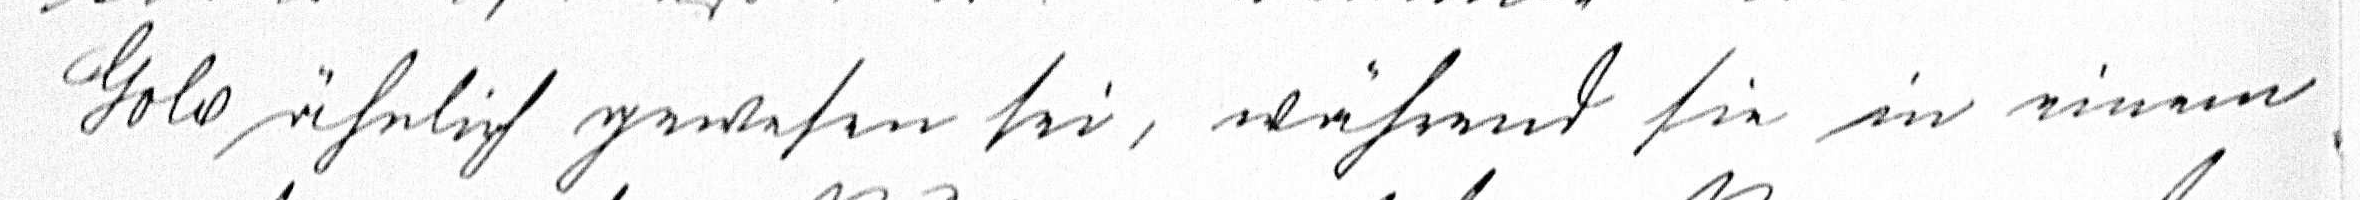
Golo ähnlich gewesen sei, während sie in einem
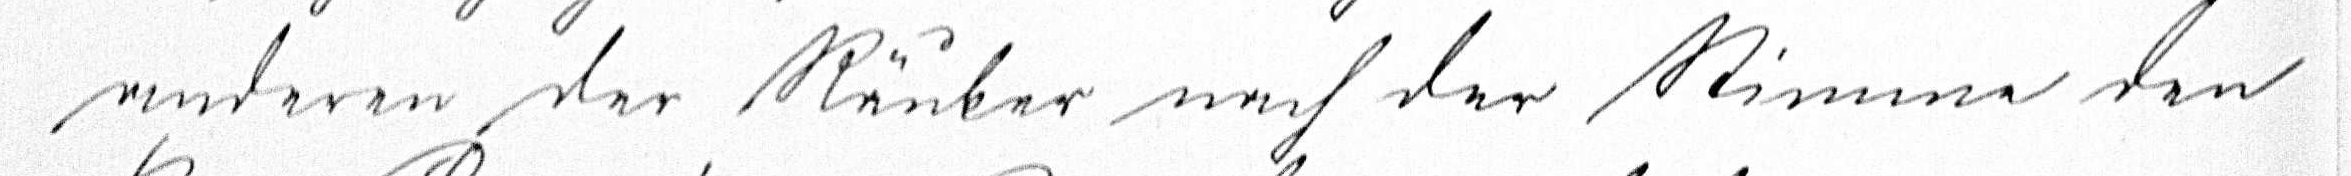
anderen der Räuber nach der Stimme den
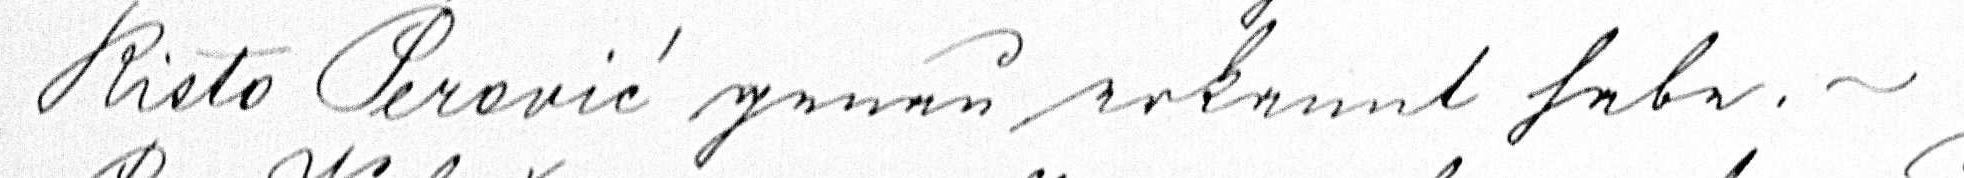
Risto Perović genau erkannt habe.
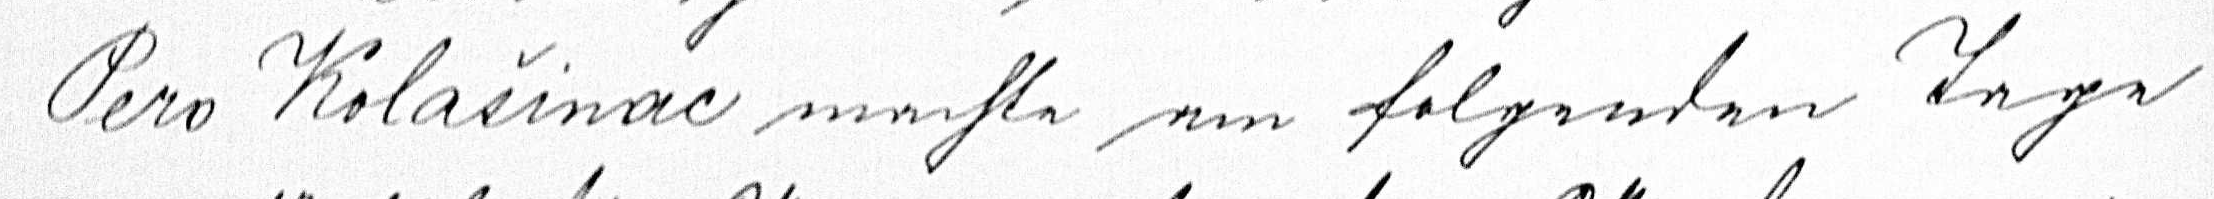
Pero Kolašinac machte am folgenden Tage
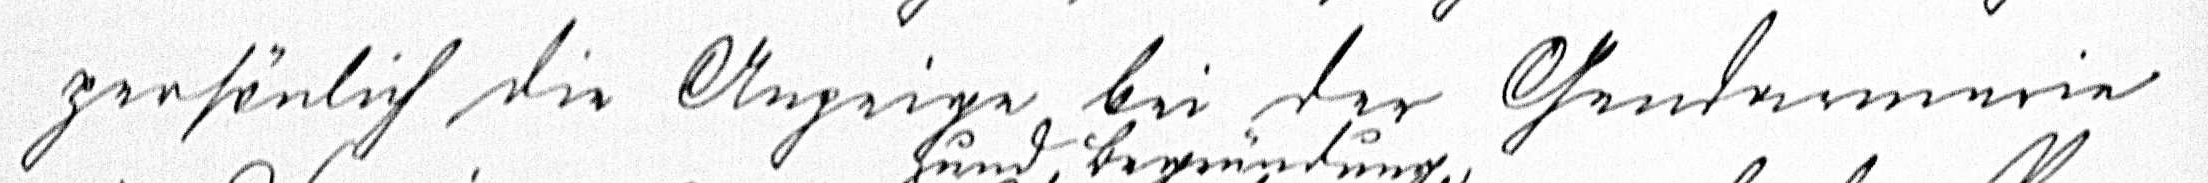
persönlich die Anzeige bei der Gendarmerie
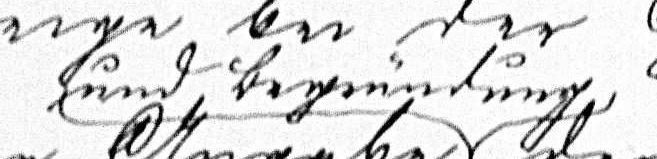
und Begründung
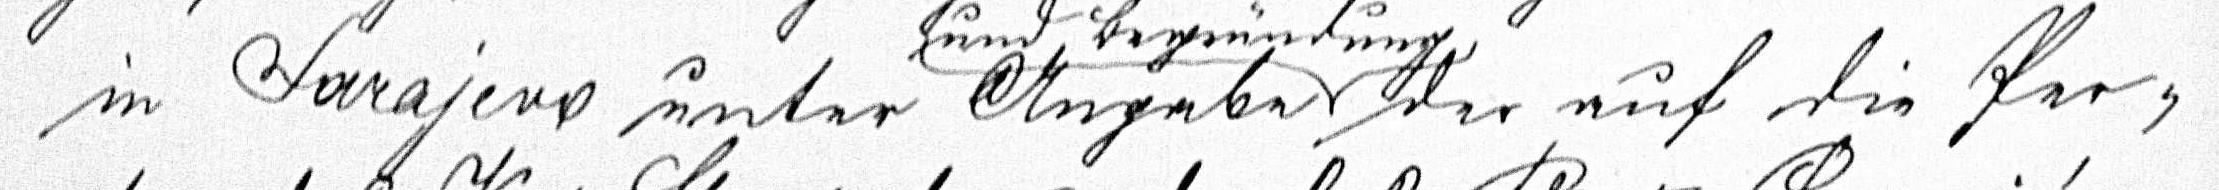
in Sarajevo unter Angabe der auf die Per¬
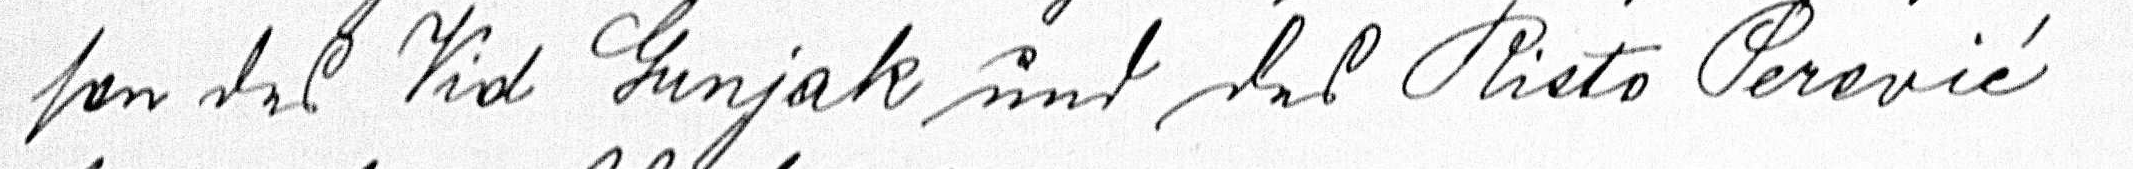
son des Vid Gunjak und des Risto Perović
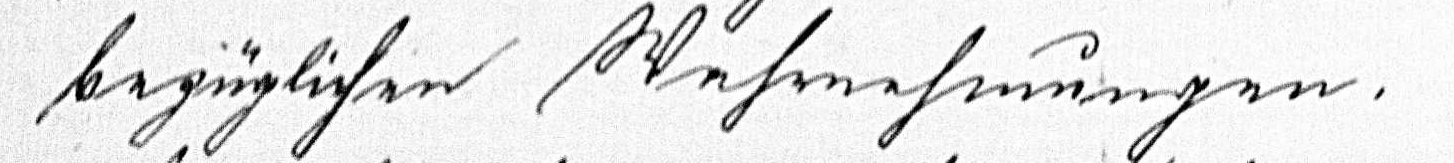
bezüglichen Wahrnehmungen.
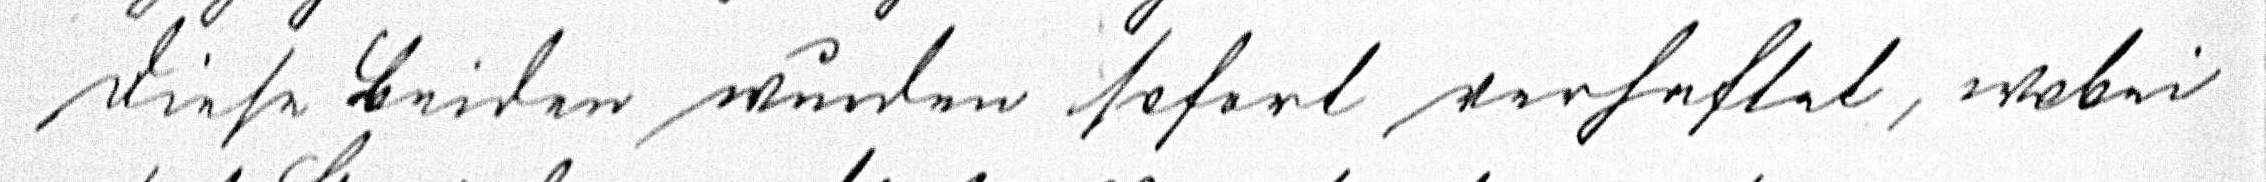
Diese Beiden wurden sofort verhaftet, wobei
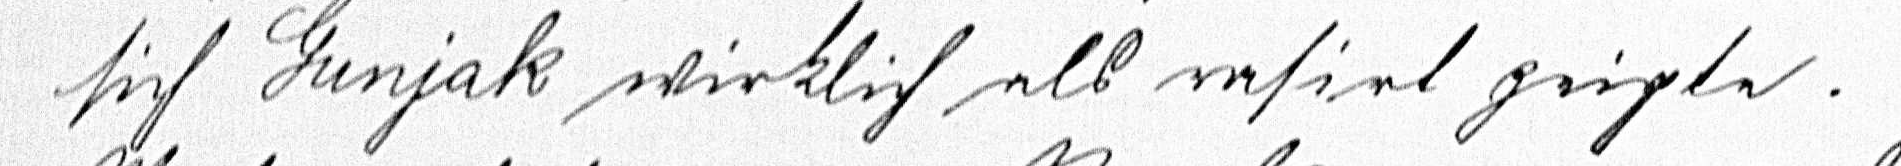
sich Gunjak wirklich als rasirt zeigte.
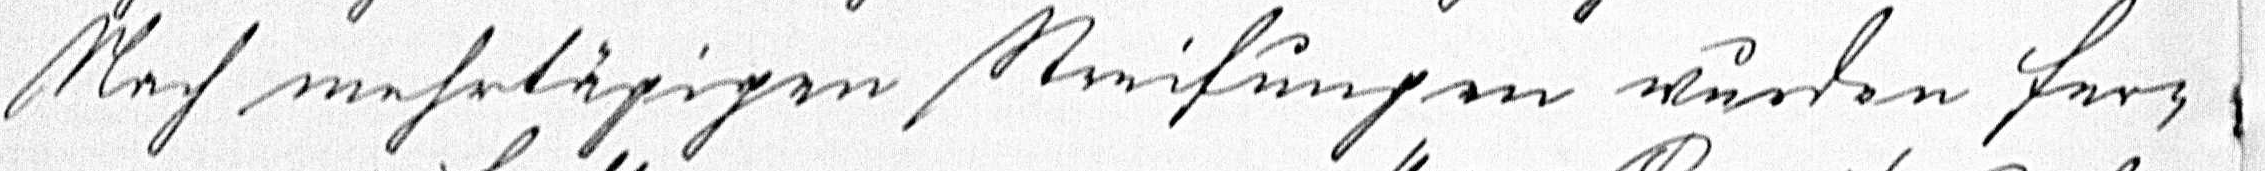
Nach mehrtägigen Streifungen wurden fer¬
